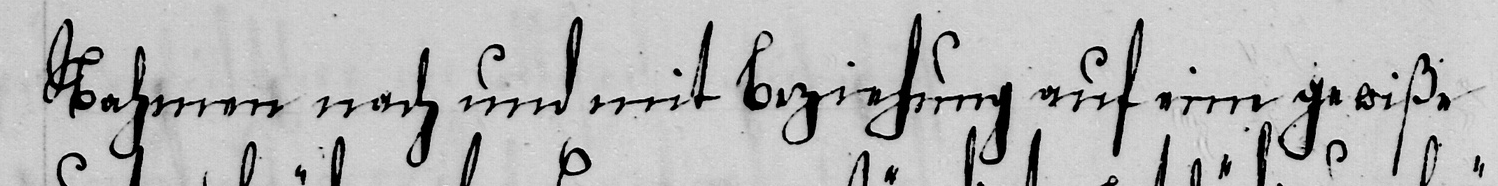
Nahmen nach und mit Beziehung auf eine gewiße
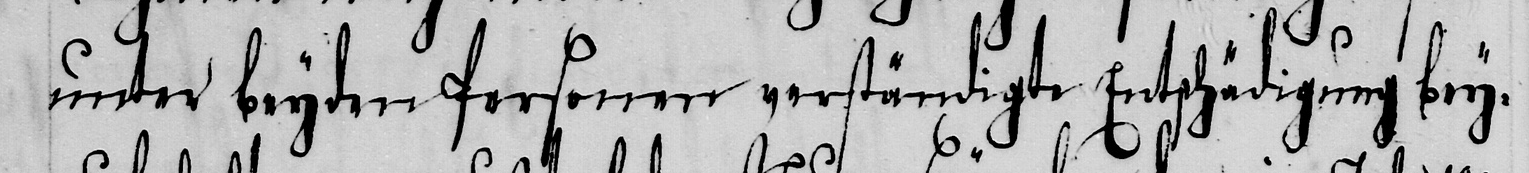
unter beyden Personen verständigte Entschädigung bey¬
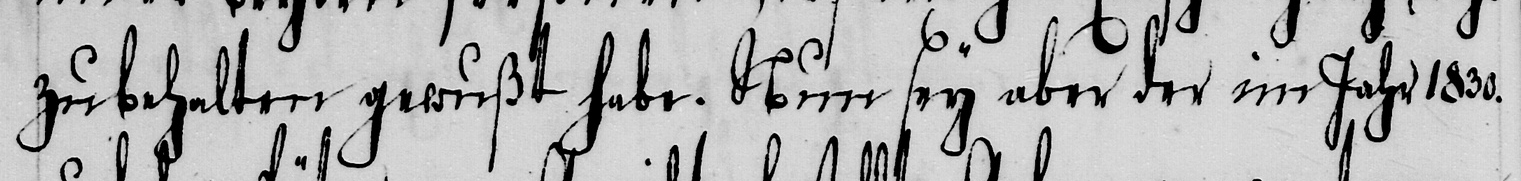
zubehalten gewußt habe. Nun sey aber der im Jahr 1830.
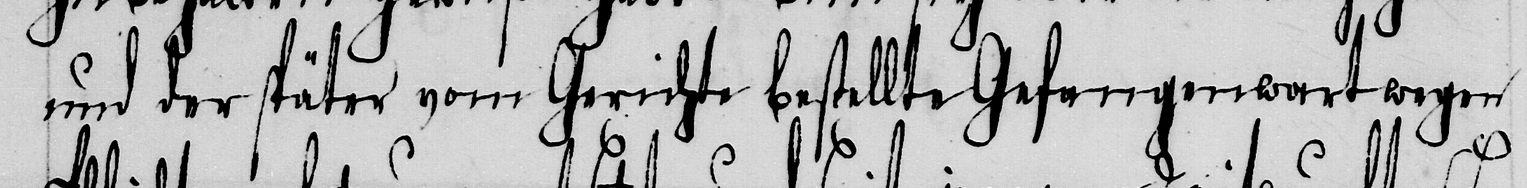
und der später vom Gerichte bestellte Gefangenwart wegen
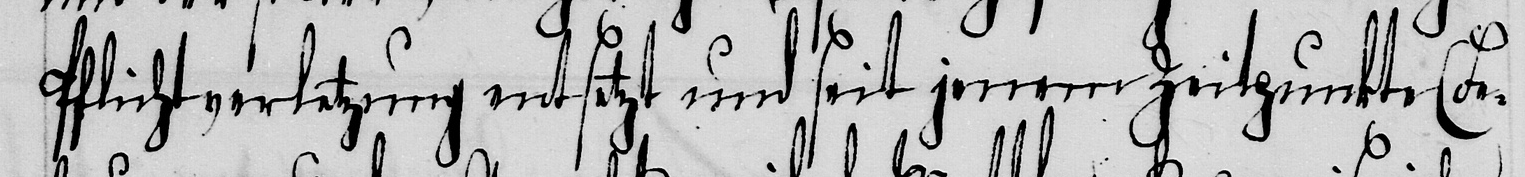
Pflichtverletzung entsetzt und seit jenem Zeitpunkte (Fe¬
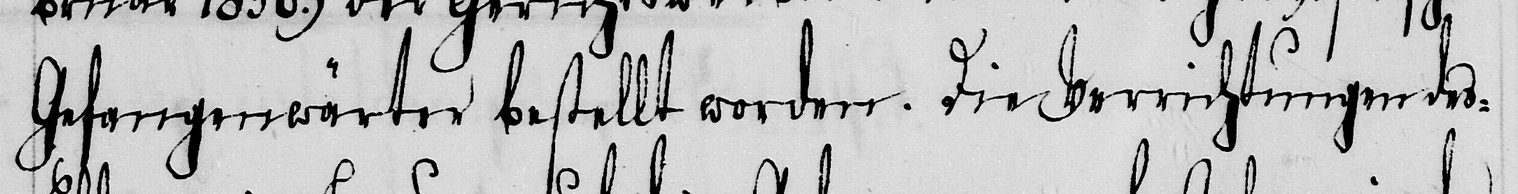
Gefangenwärter bestellt worden. Die Verrichtungen des¬
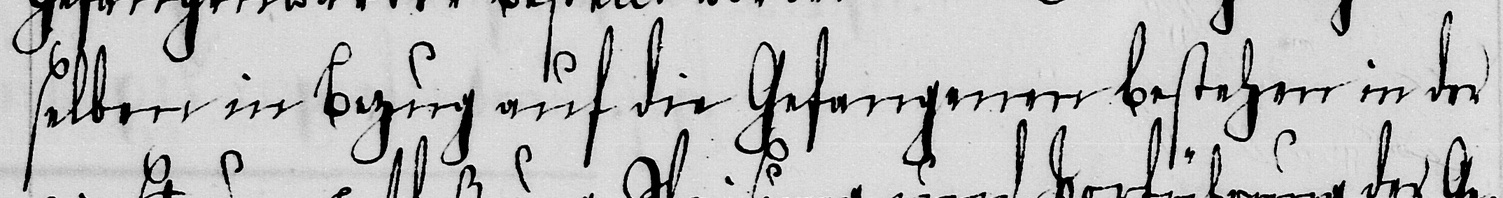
selben in Bezug auf die Gefangenen bestehen in der
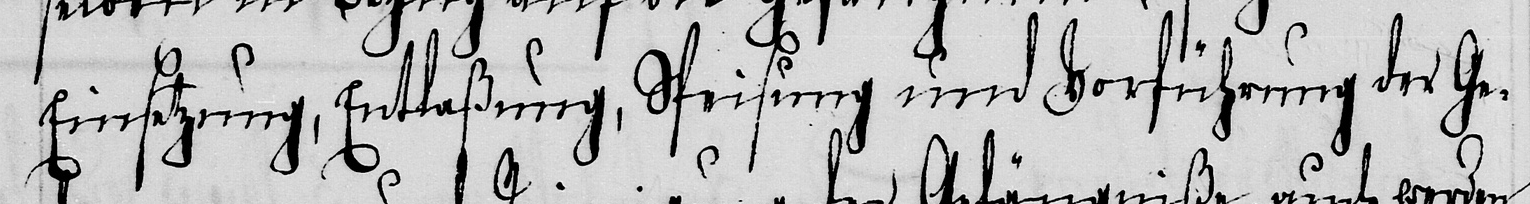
Einsetzung, Entlaßung, Speisung und Vorführung der Ge¬
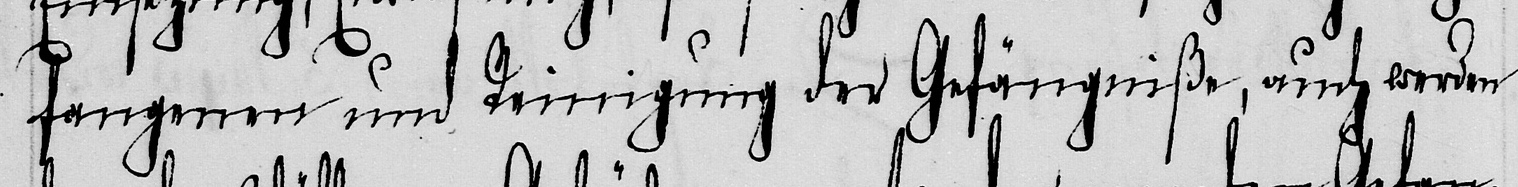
fangenen und Reinigung der Gefängniße, auch werden
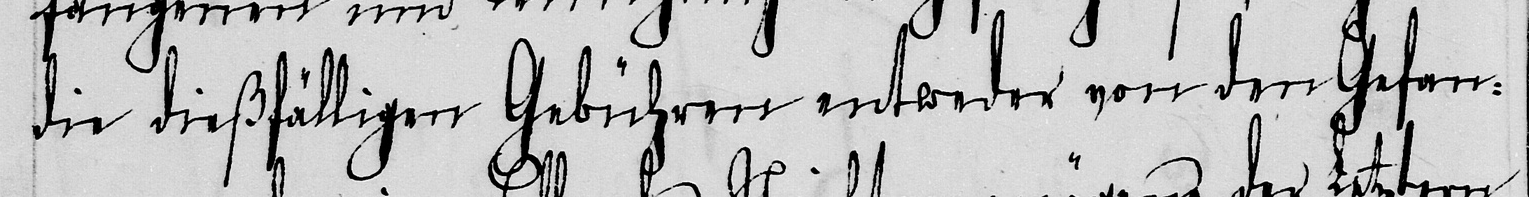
die dießfälligen Gebühren entweder von den Gefan¬
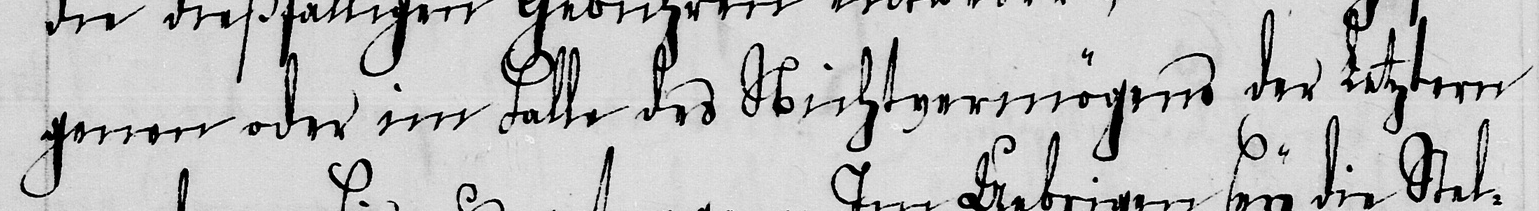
genen oder im Falle des Nichtvermögens der Letztern
